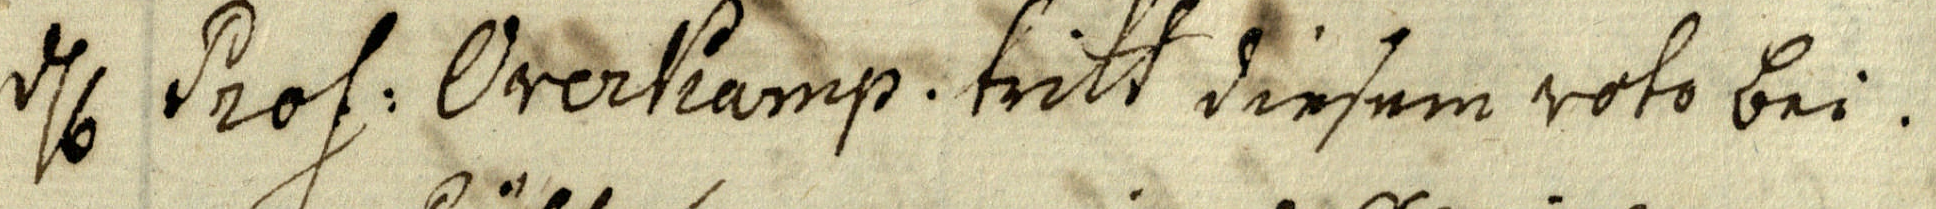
dh Prof. Overkamp. tritt diesem voto bei.
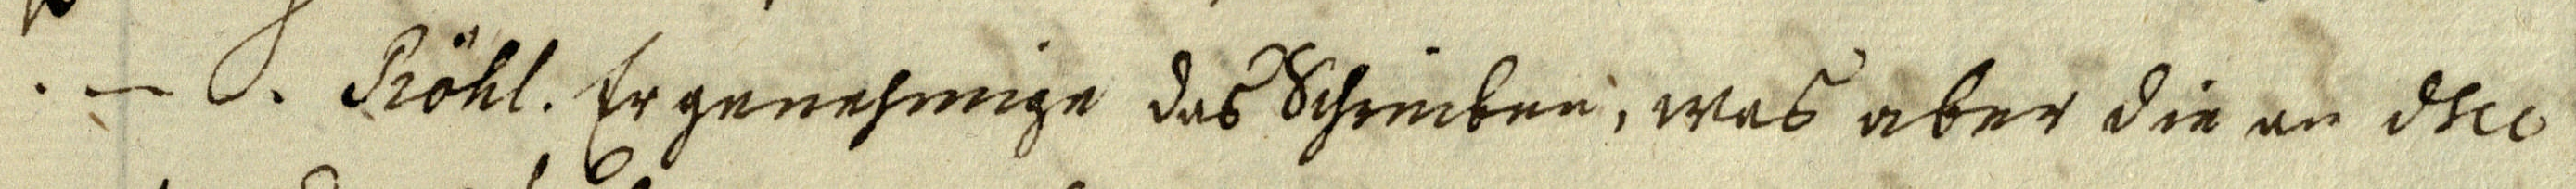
Röhl. Er genehmige das Schreiben, was aber die an dh
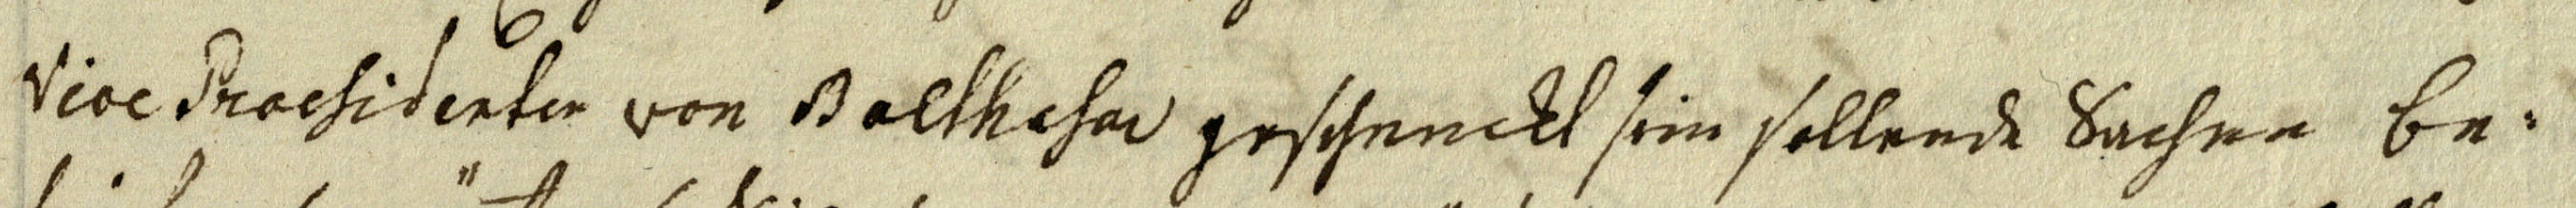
VicePraesidenten von Balthasar geschenckt sein sollende Sachen be¬
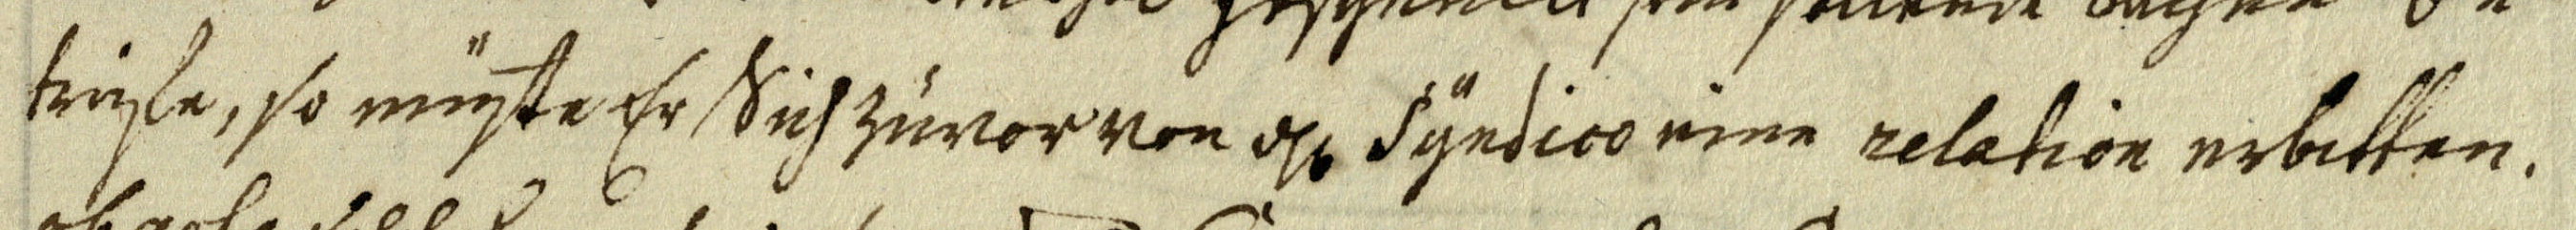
träfe, so müste Er Sich zuvor von dh Sÿndico eine relation erbitten,
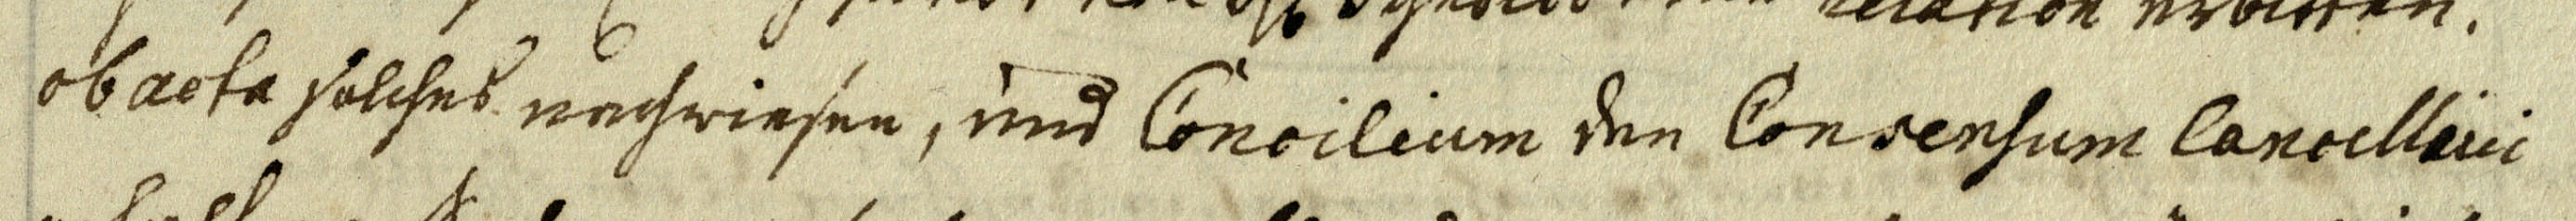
ob acta solches nachwiesen, und Concilium den Consensum Cancellarii
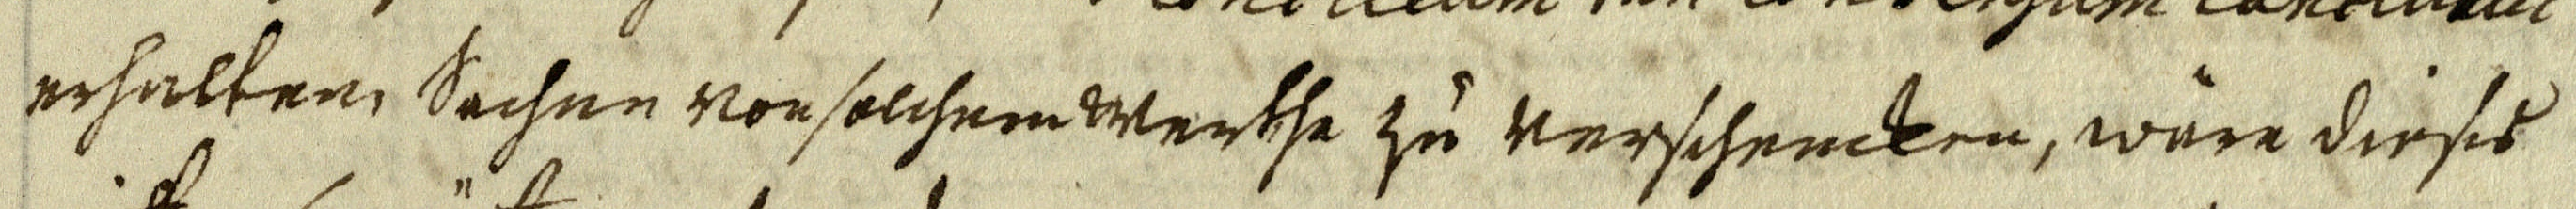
erhalten, Sachen von solchem Werthe zu verschencken, wäre dieses
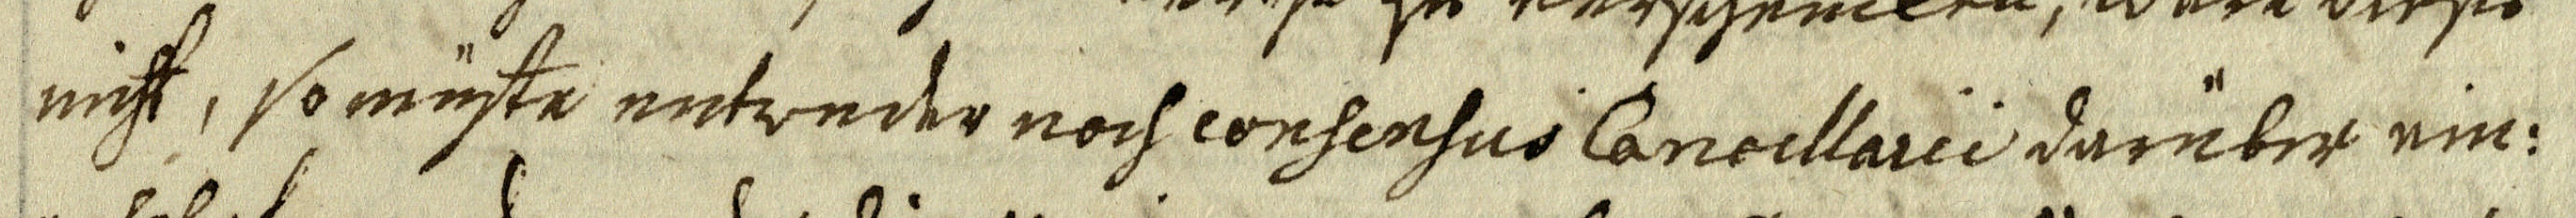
nicht, so müste entweder noch consensus Cancellarii darüber ein¬
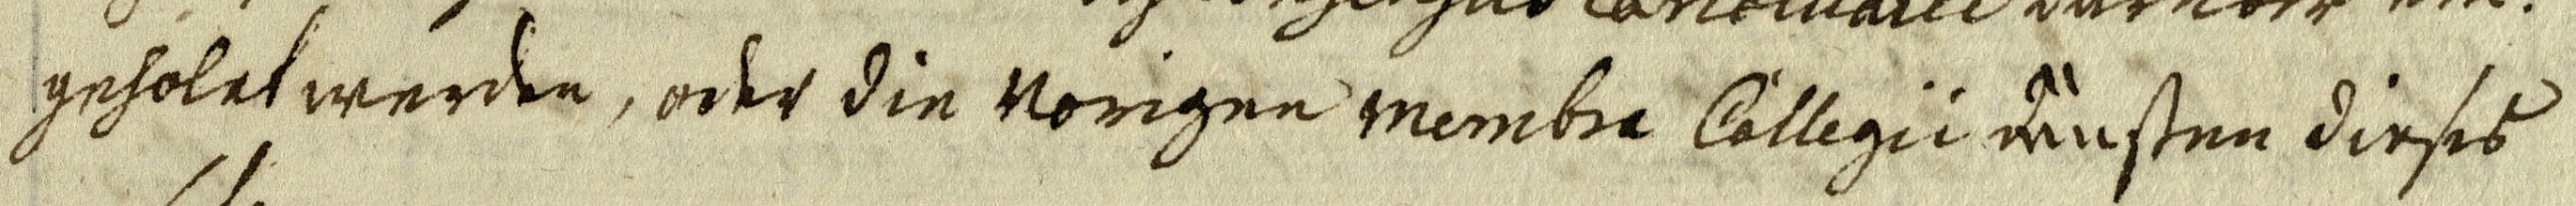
geholet werden, oder die vorigen membra Collegii müsten dieses
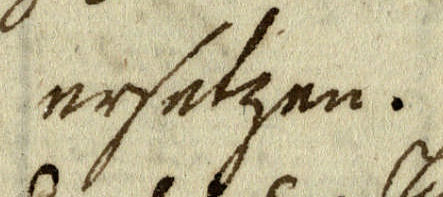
ersetzen.
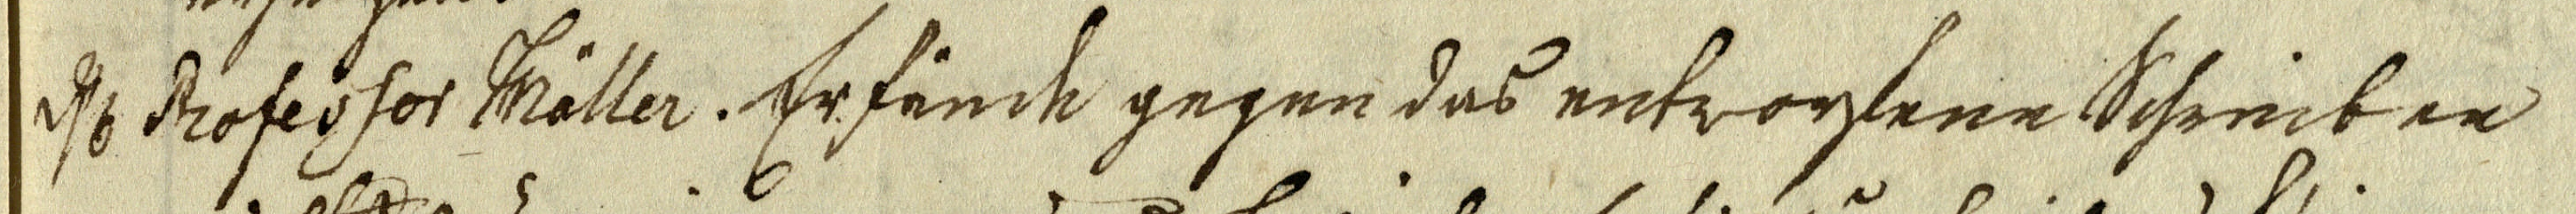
dh Professor Möller. Er fände gegen das entworfene Schreiben
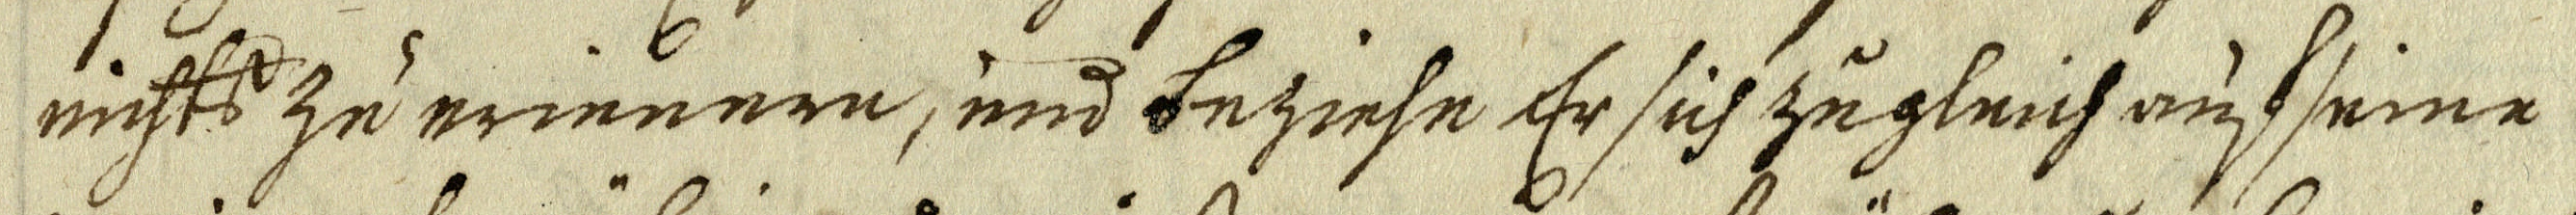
nichts zuerinnern, und beziehe Er sich zugleich auf seine
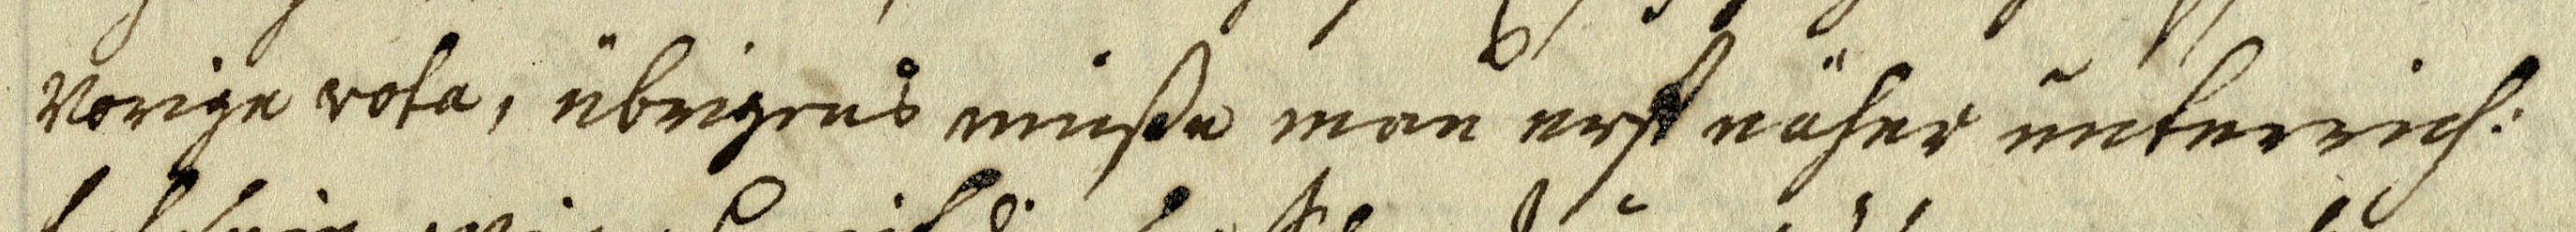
vorige vota, übrigens müße man erst näher unterrich¬
